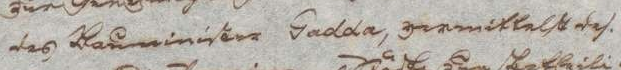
des Bauminister Gadda, vermittelst des-
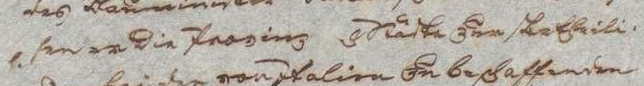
sen er die Provinz & Städte zur Betheili-
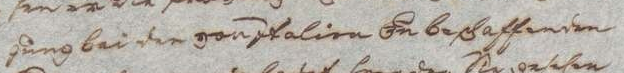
gung bei der von Italien zu beschaffenden
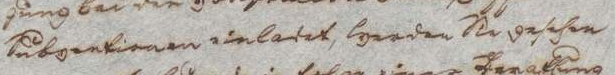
Subventionen einladet, werden Sie gesehen
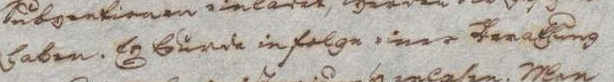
haben. Es wurde in Folge einer Berathung
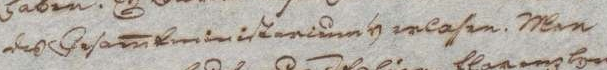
des Gesammtministerium's erlassen. Man
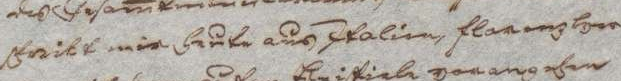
schreibt mir heute aus Italien, Florenz wer-
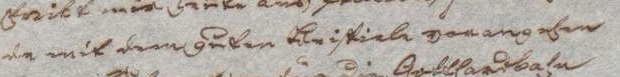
de mit dem guten Beispiele vorangehen
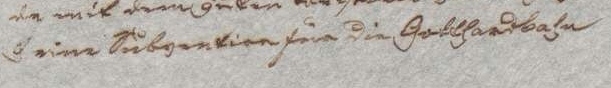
& eine Subvention für die Gotthardbahn
